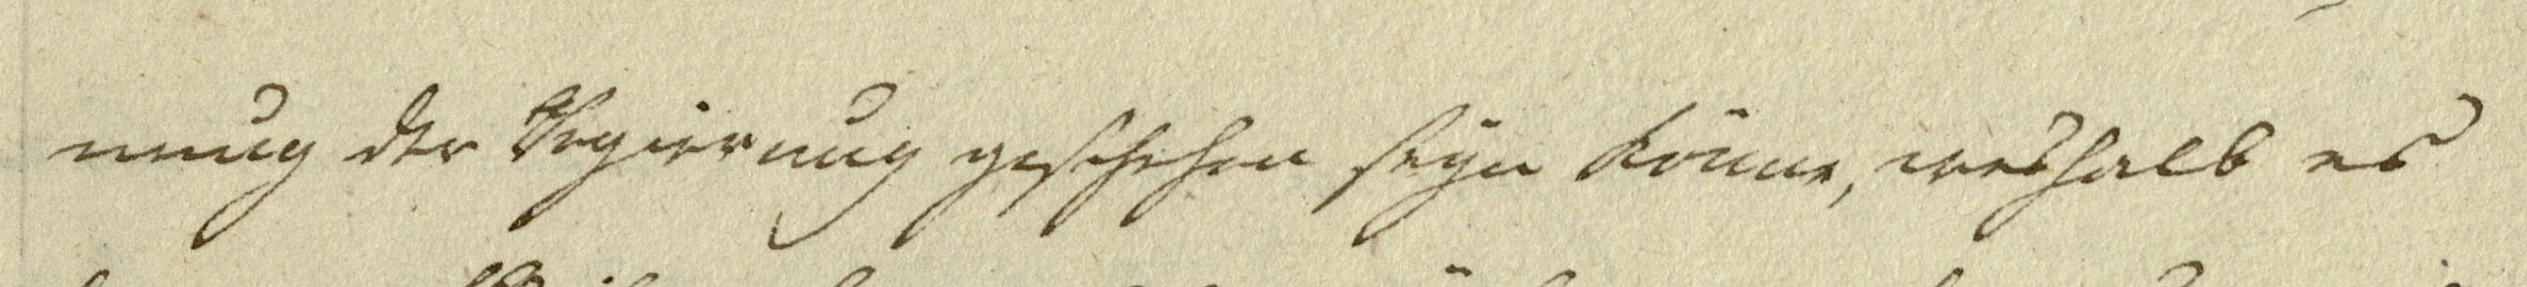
nung der Regierung geschehen seÿn könne, weshalb es
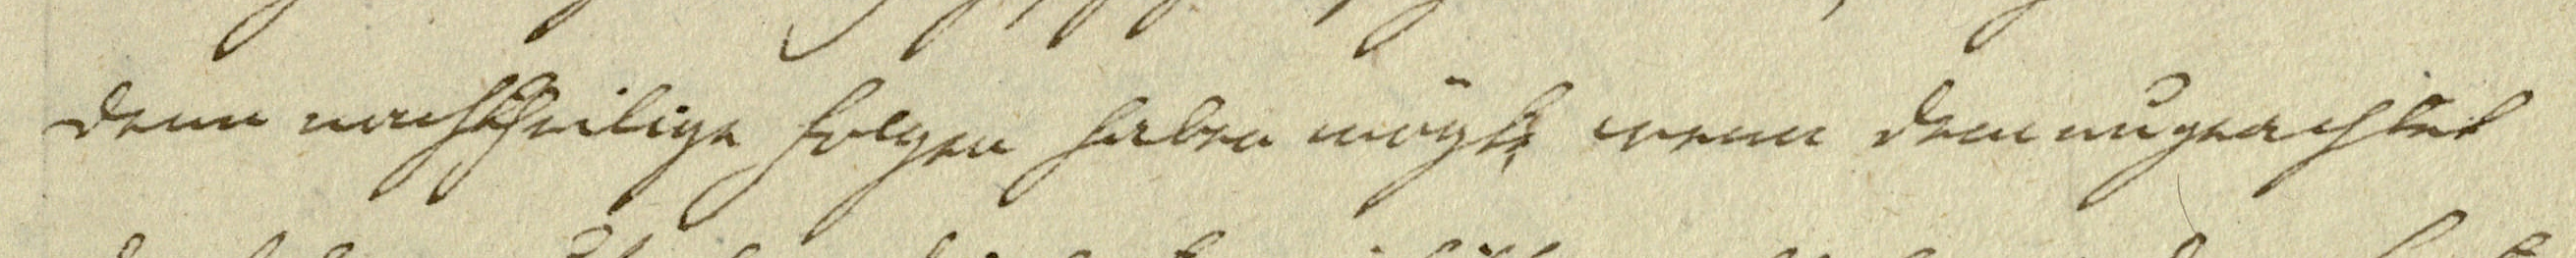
denn nachtheilige Folgen haben mögte, wenn dem ungeachtet
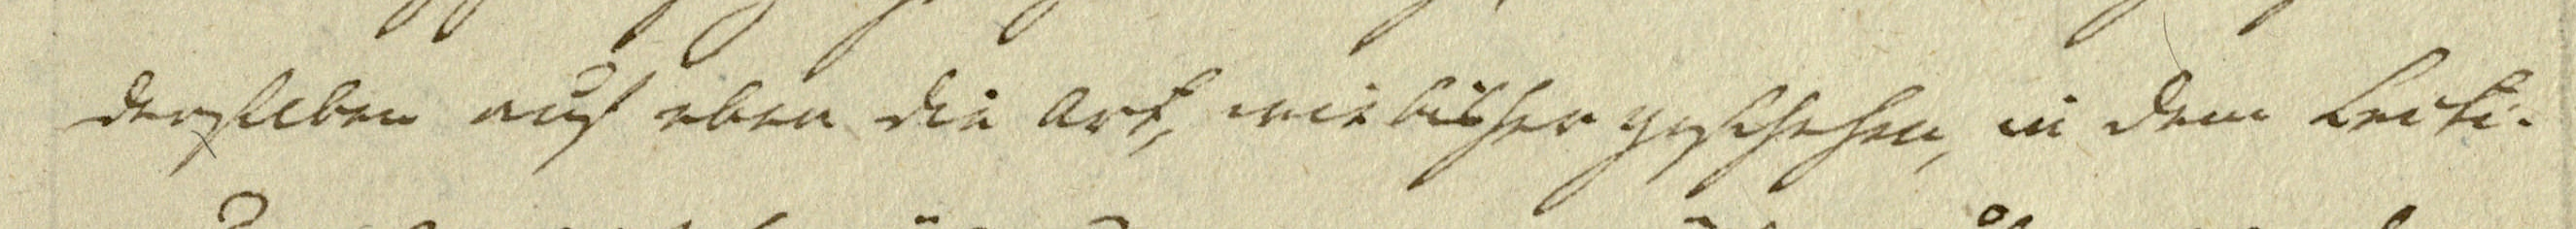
derselben auf eben die Art wie bisher geschehen, in dem Lecti¬
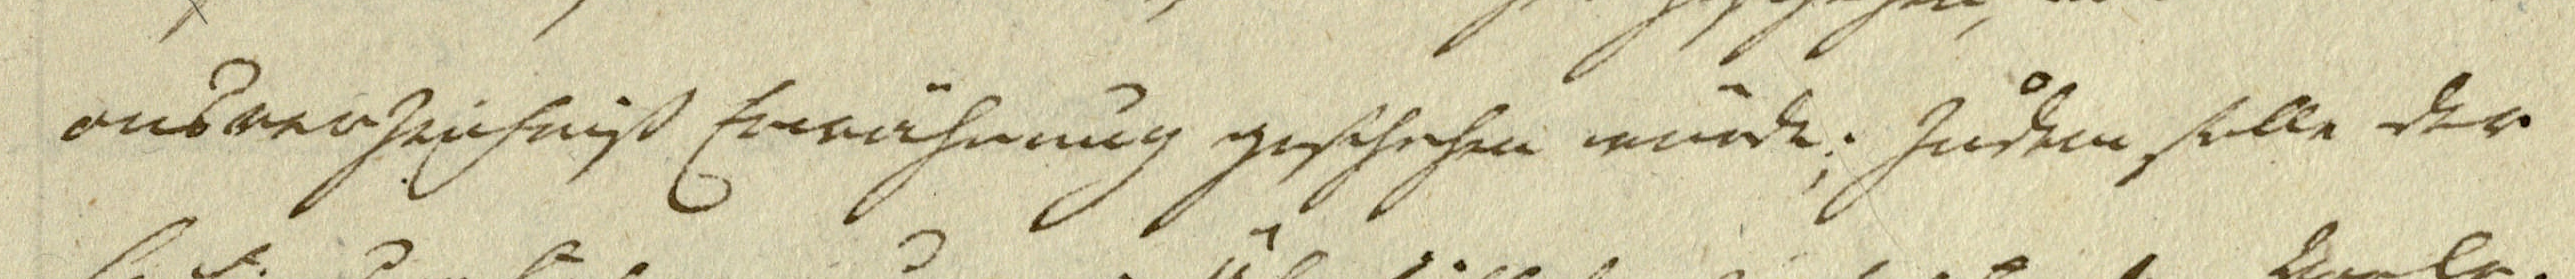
onsverzeichnis Erwähnung geschehen würde; zudem solle der
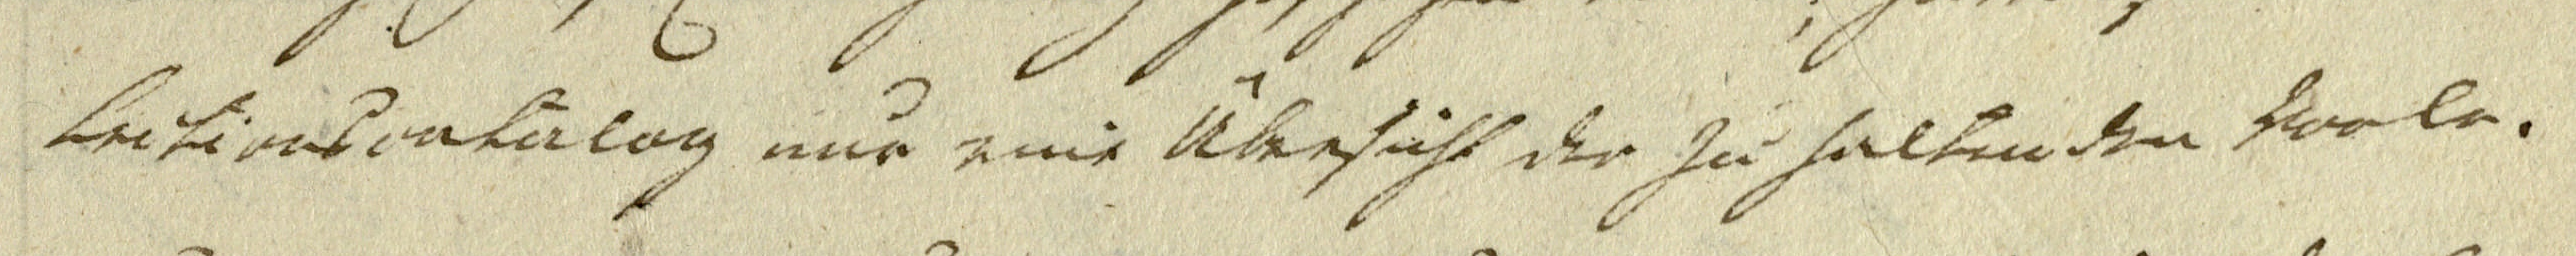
Lectionscatalog nur eine Übersicht der zu haltenden Vorle¬
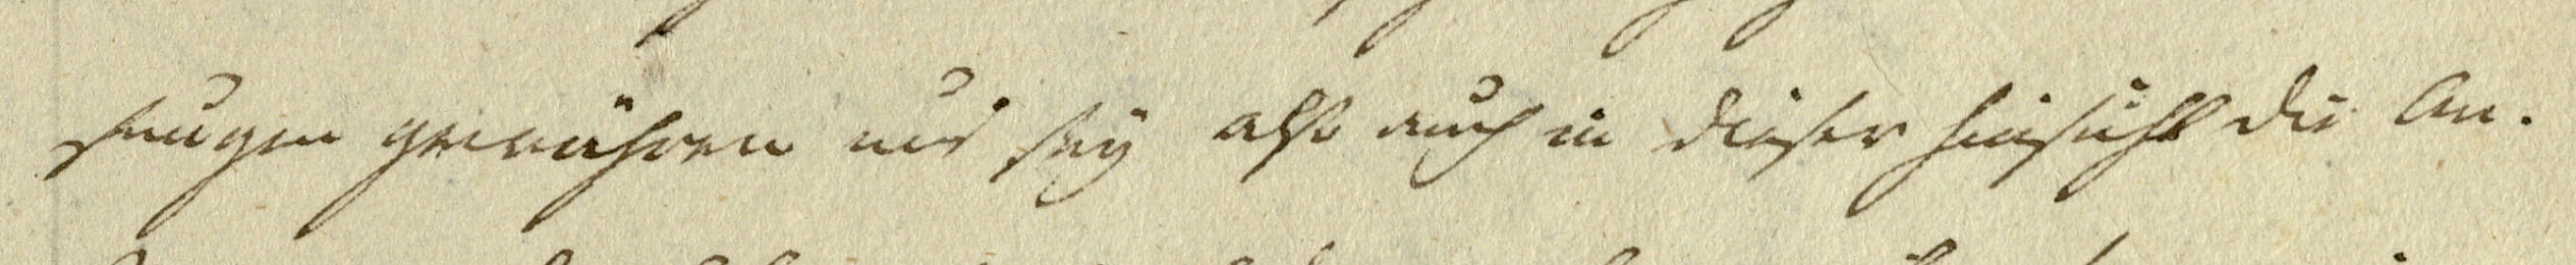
sungen gewähren und seÿ also auch in dieser Hinsicht die An¬
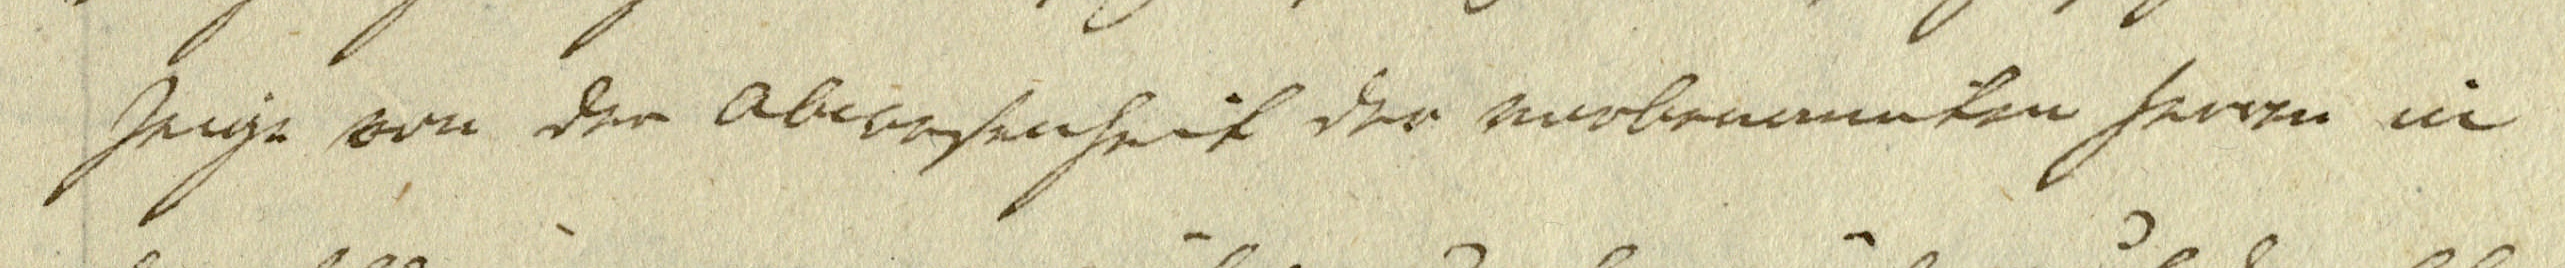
zeige von der Abwesenheit der vorbenannten Herren in
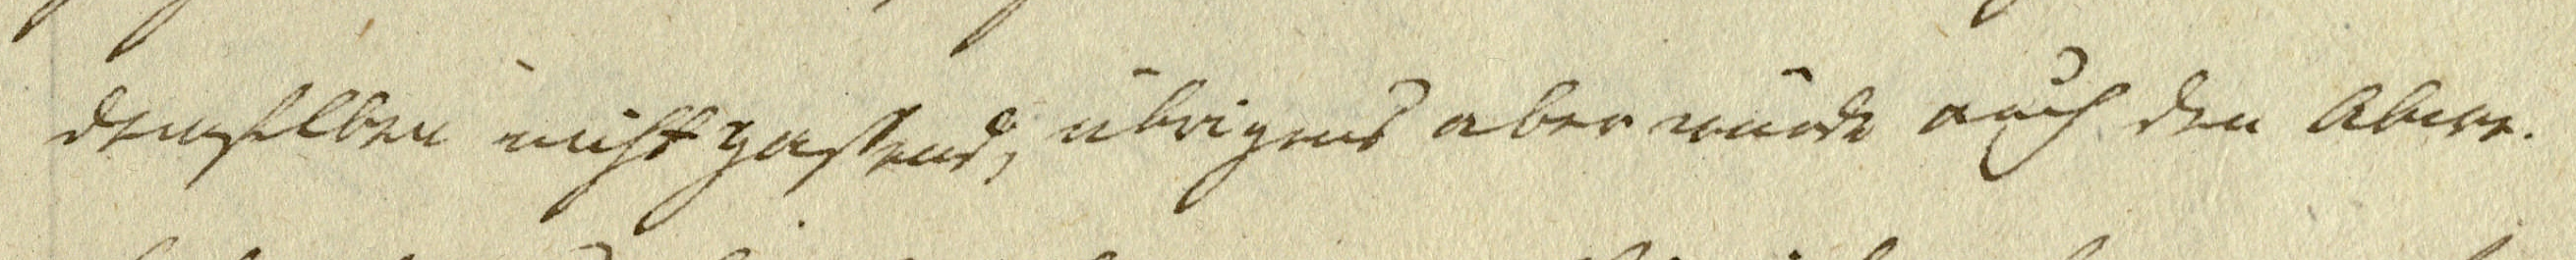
demselben nicht passend, übrigens aber würde auch den Abwe¬
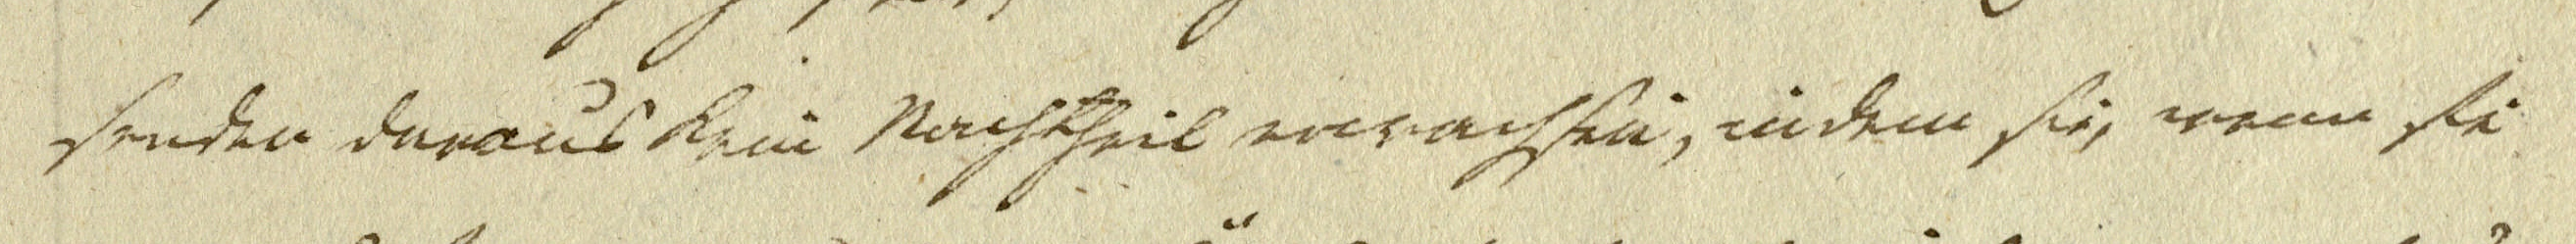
senden daraus kein Nachtheil erwachsen, in dem sie, wenn sie
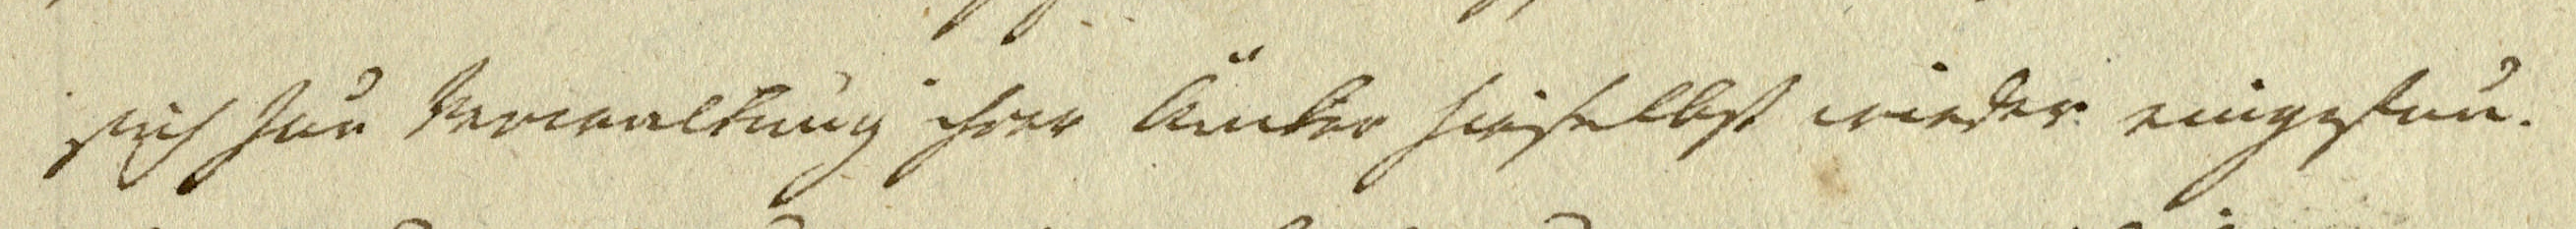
sich zur Verwaltung ihrer Ämter hieselbst wieder eingefun¬
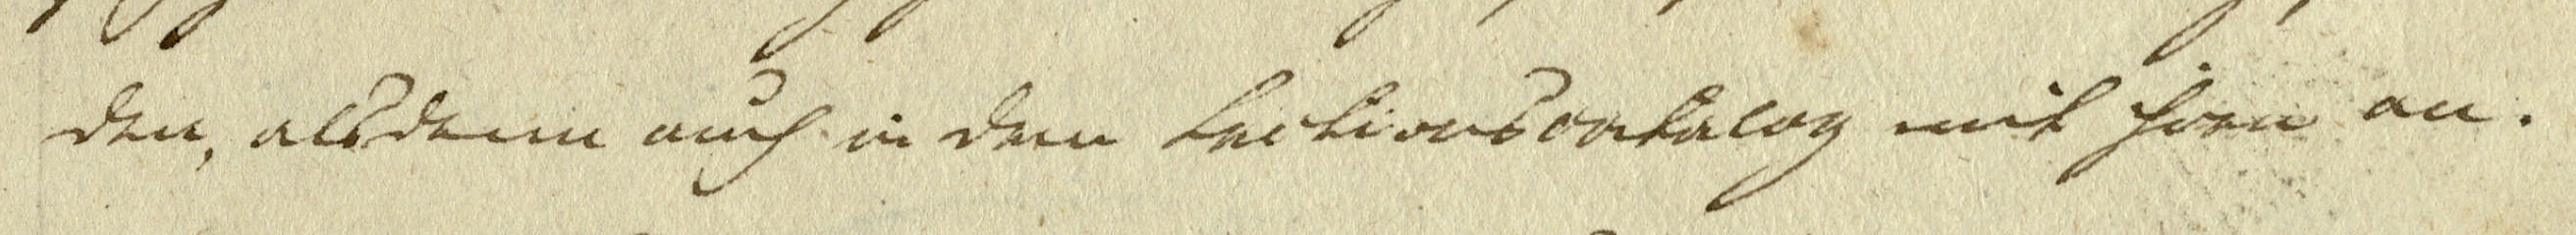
den, alsdenn auch in dem Lectionscatalog mit ihren an¬
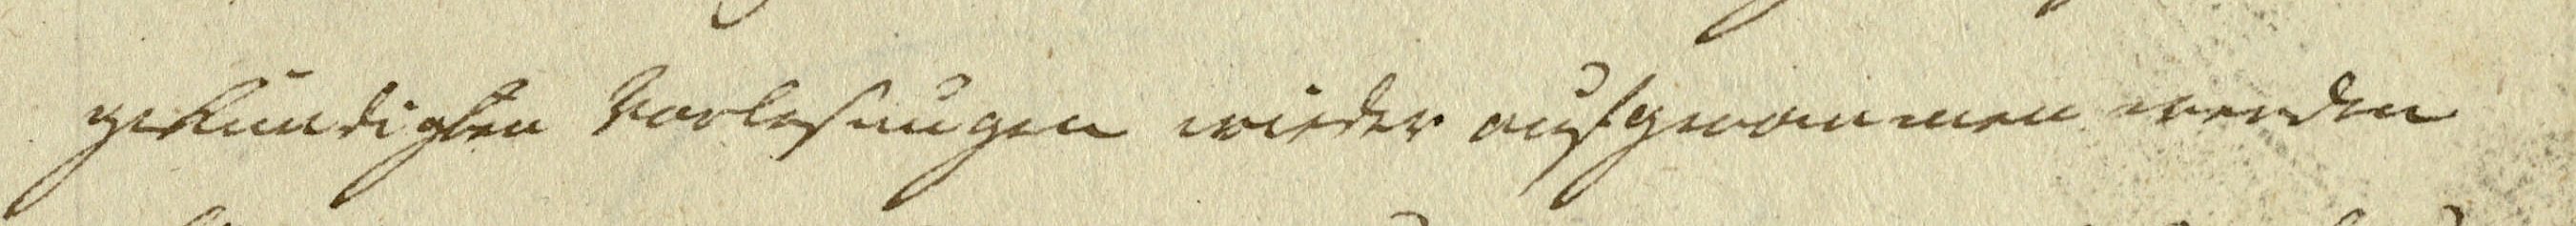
gekündigten Vorlesungen wieder aufgenommen werden
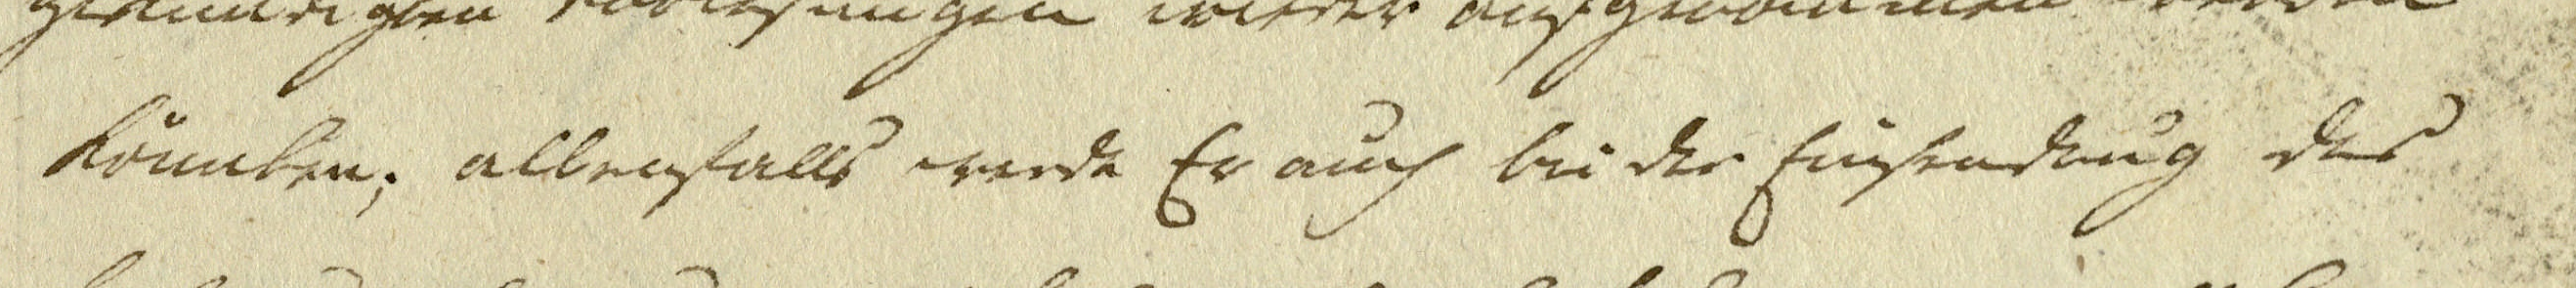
könnten; allenfalls werde Er auch bei der Einsendung des
